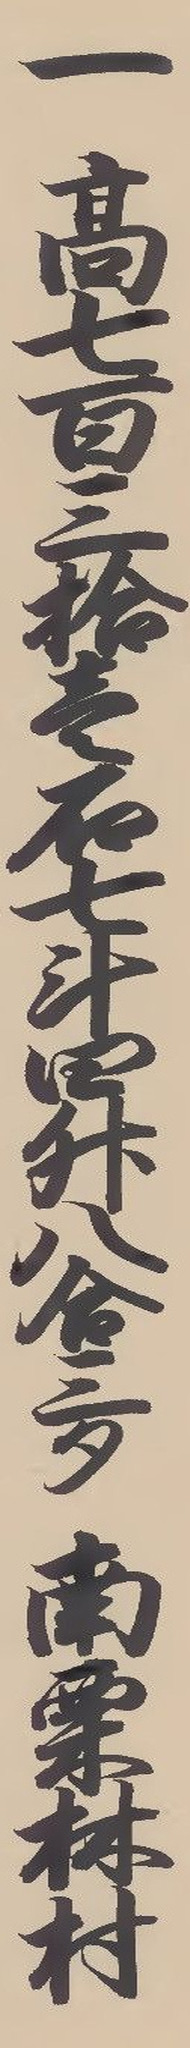一高七百三拾壱石七斗四升八合三勺南栗林村
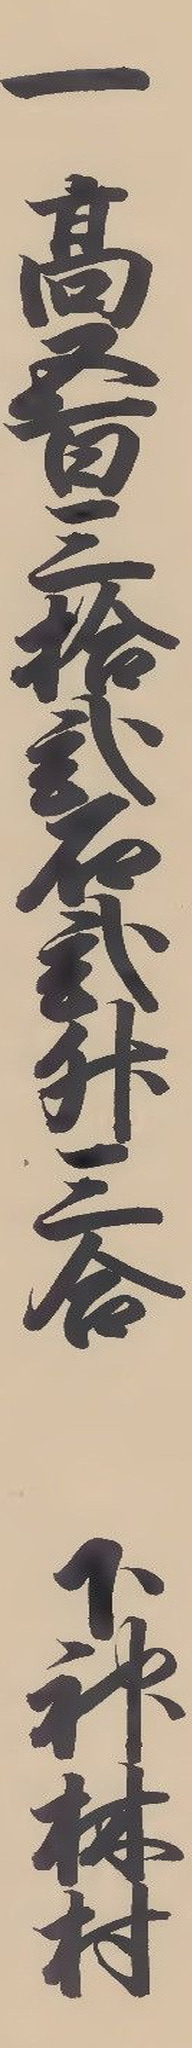一高五百三拾弐石弐升三合下神林村
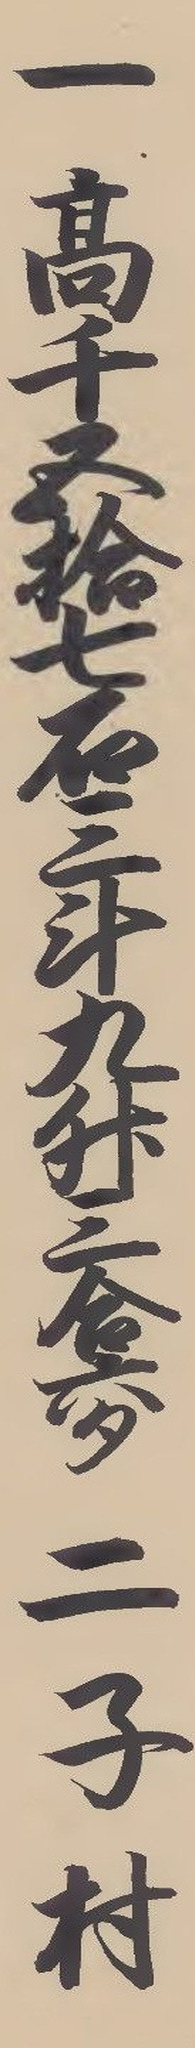一高千五拾七石三斗九升三合六勺二子村
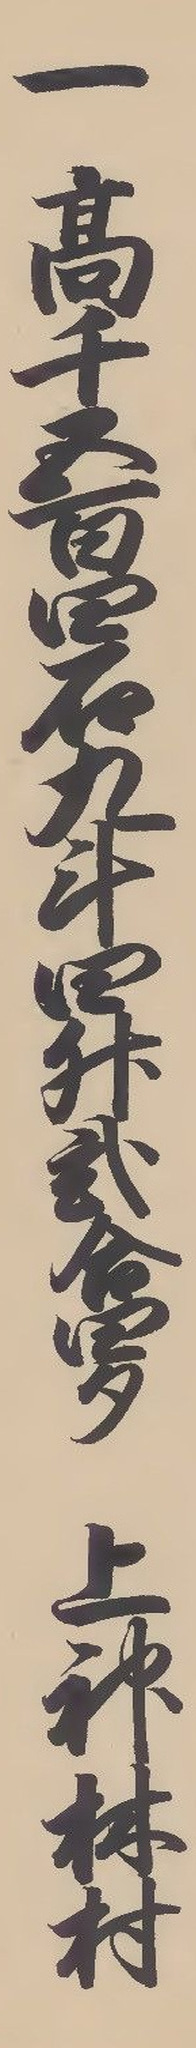一高千五百四石九斗四升弐合四勺上神林村

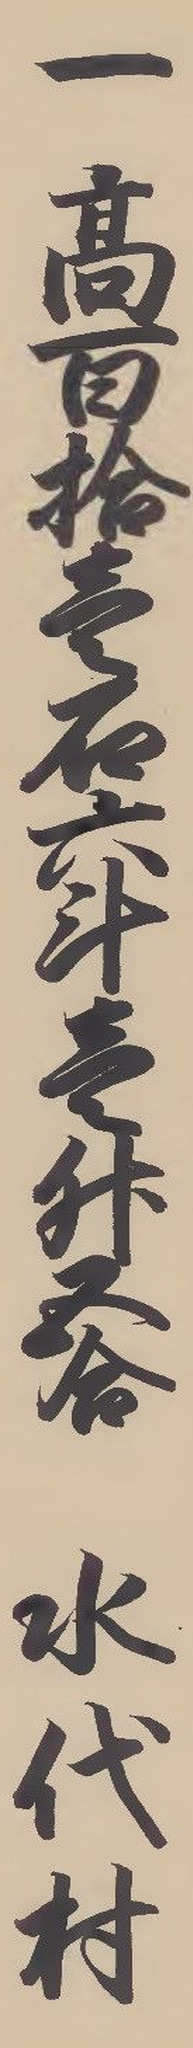一高百拾壱石六斗壱升五合水代村
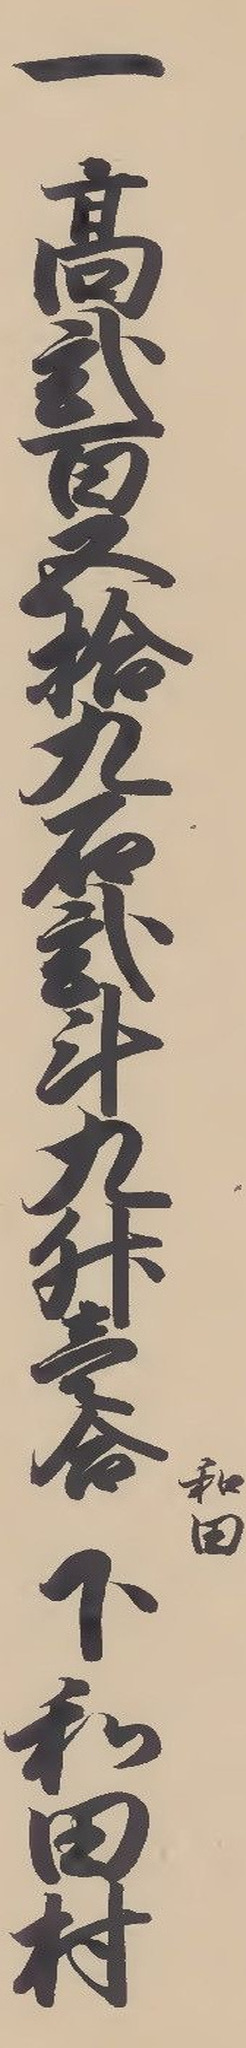一高弐百五拾九石弐斗九升壱合下和田村
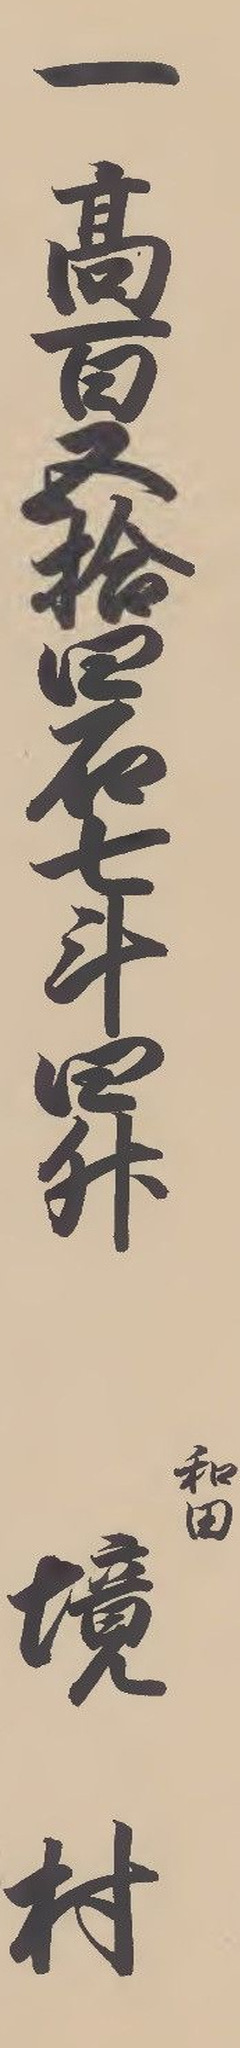一高百五拾四石七斗四升境村
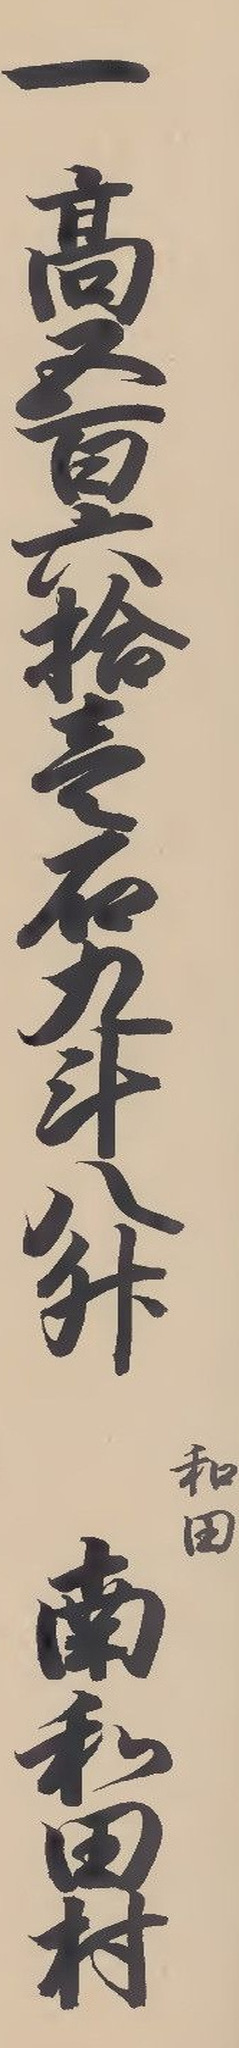一高五百六拾壱石九斗八升南和田村
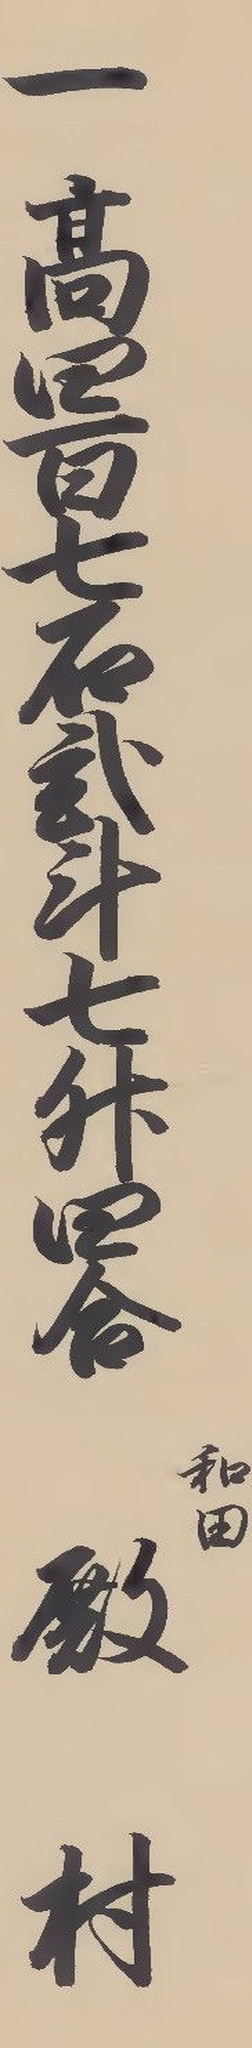一高四百七石弐斗七升四合殿村
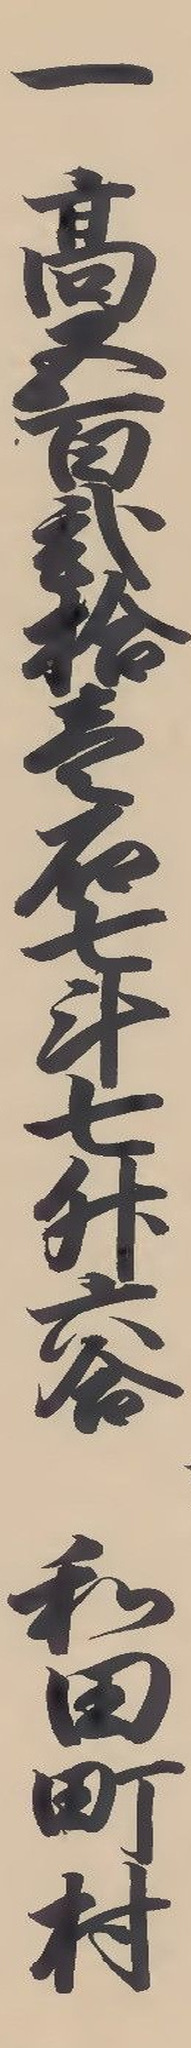一高五百弐拾壱石七斗七升六合和田町村
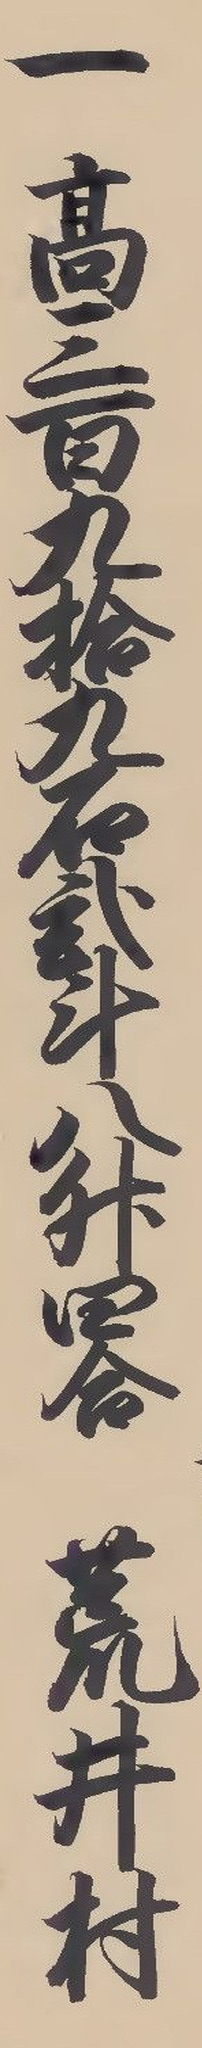一高三百九拾九石弐斗八升四合荒井村

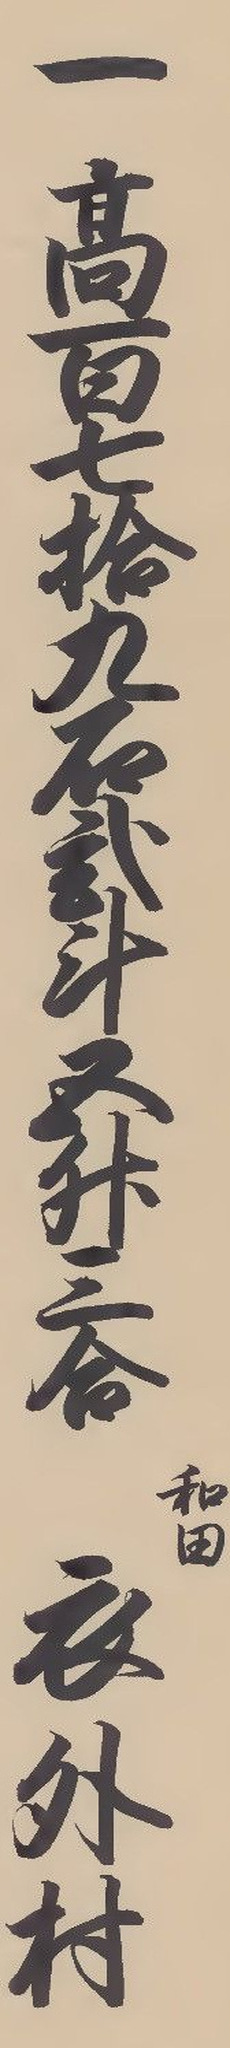一高百七拾九石弐斗五升三合衣外村
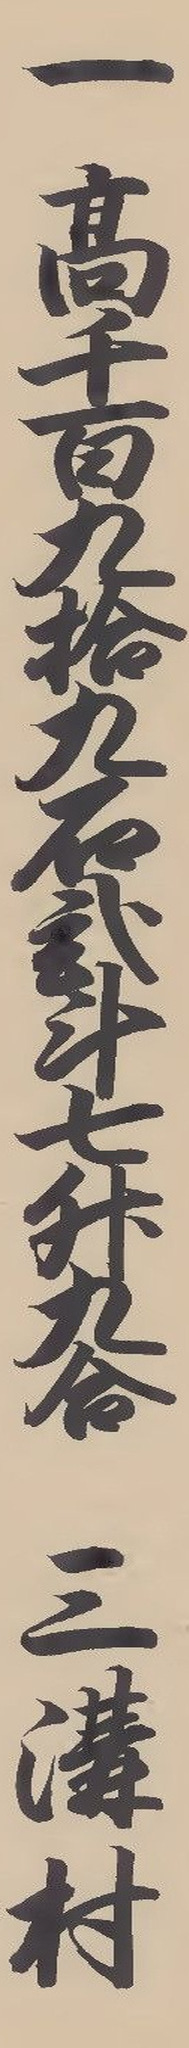一高千百九拾九石弐斗七升九合三溝村
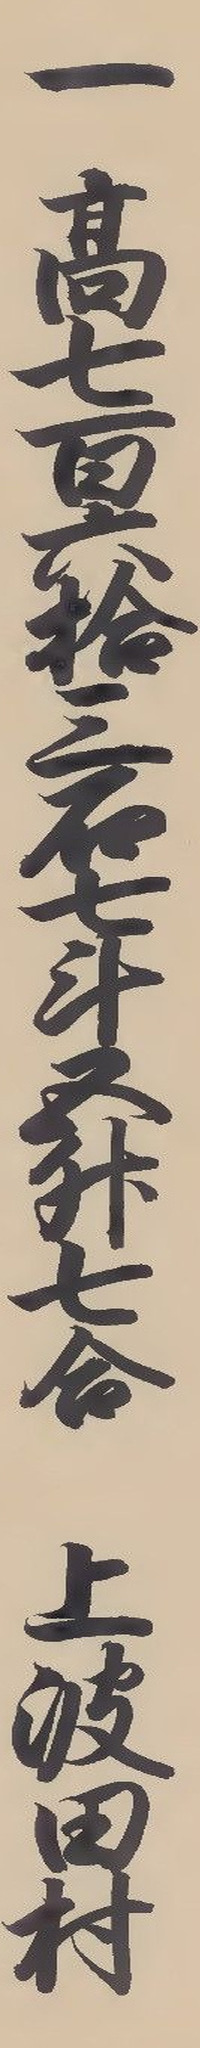一高七百六拾三石七斗五升七合上波田村
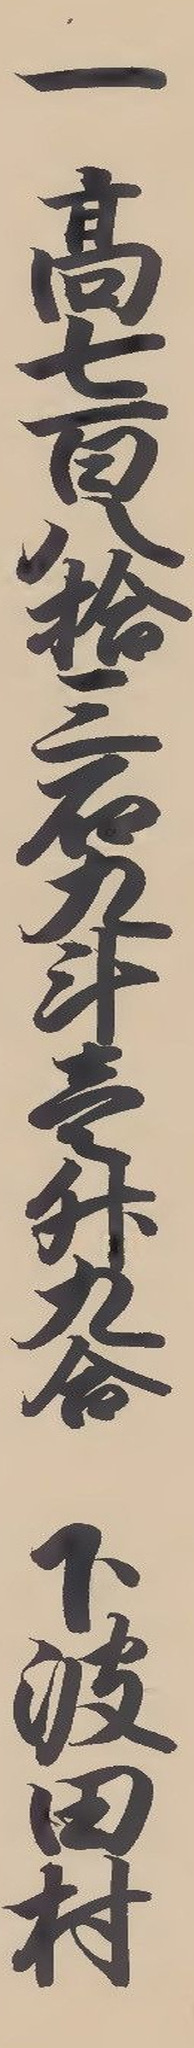一高七百八拾三石九斗壱升九合下波田村
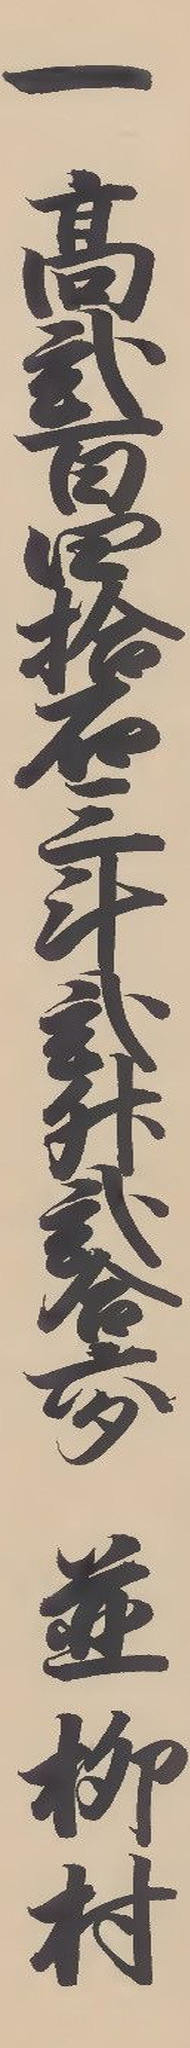一高弐百四拾石三斗弐升弐合六勺並柳村
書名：信濃国郷帳
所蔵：国立公文書館 National Archives of Japan
